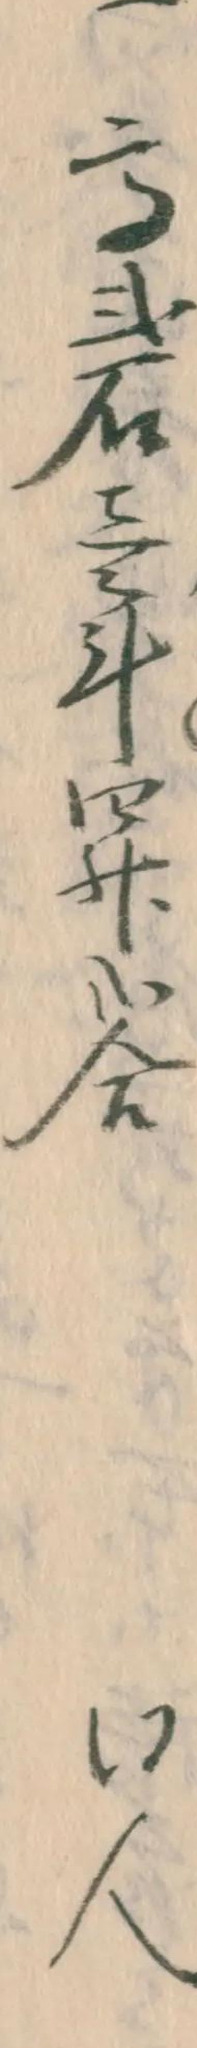一高弐石壱斗四升弐合同人
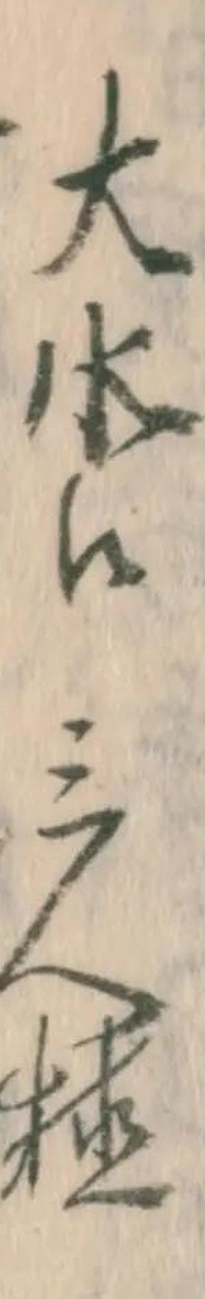大水口三人植
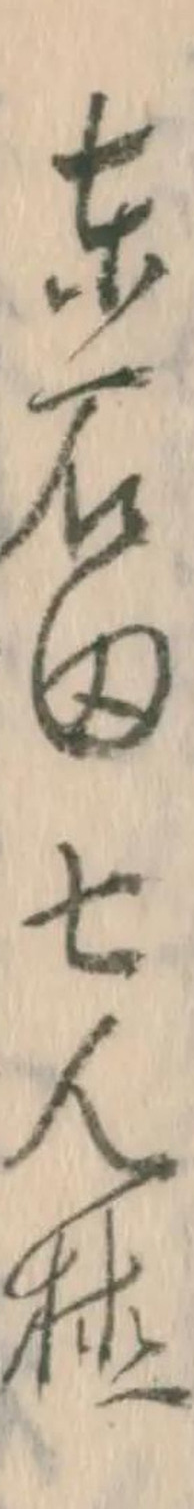東石田七人植
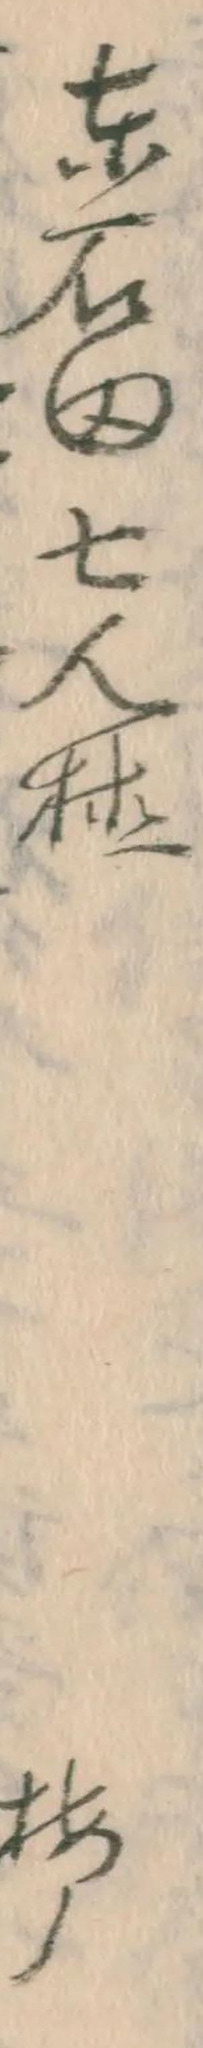東石田七人植
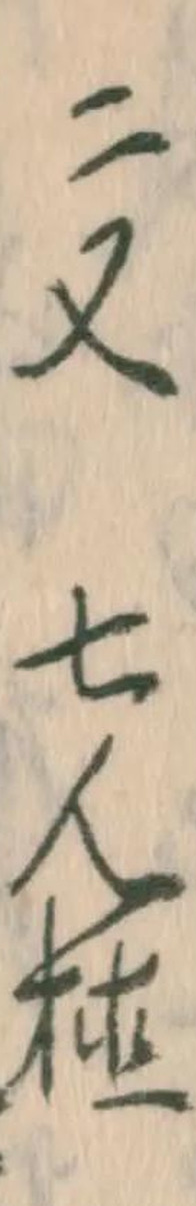ニ又七人植
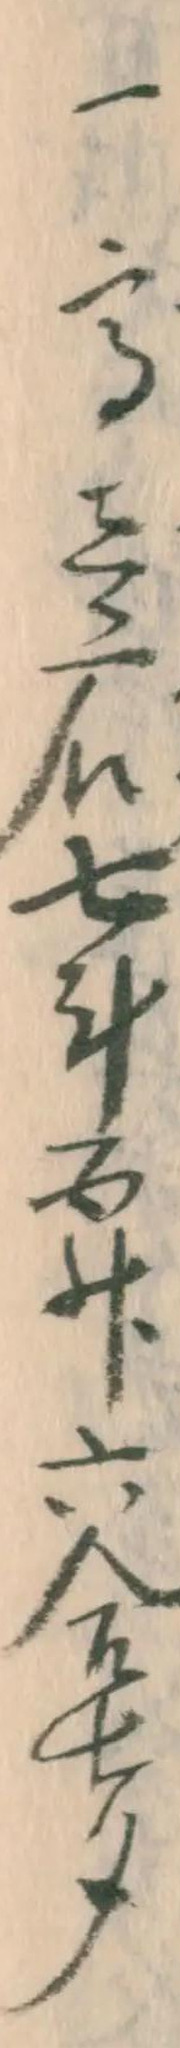一高壱石七斗五升六合七夕同人
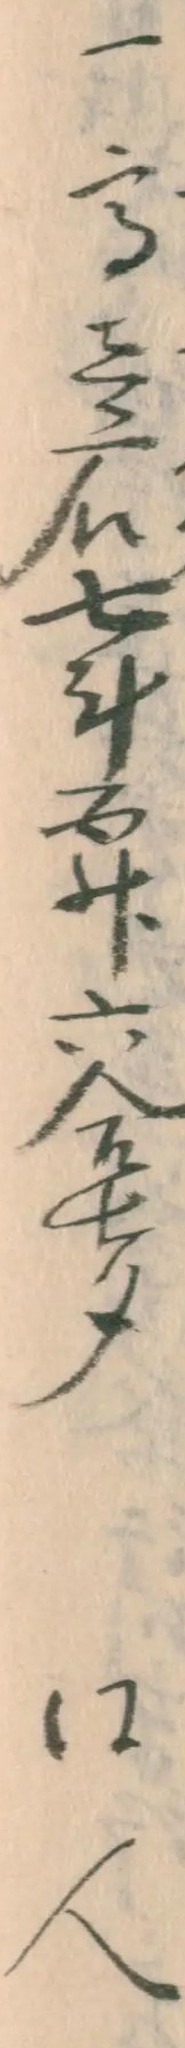一高壱石七斗五升六合七夕同人
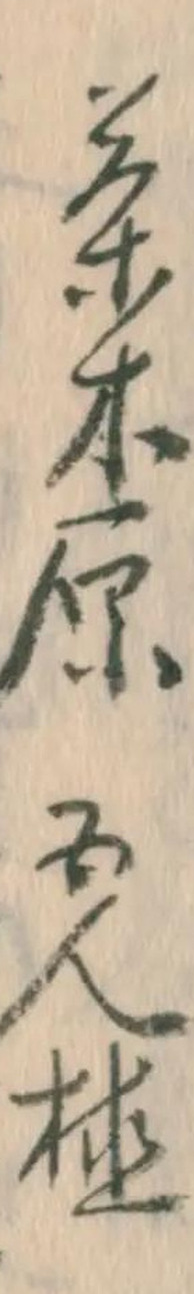茶木原五人植
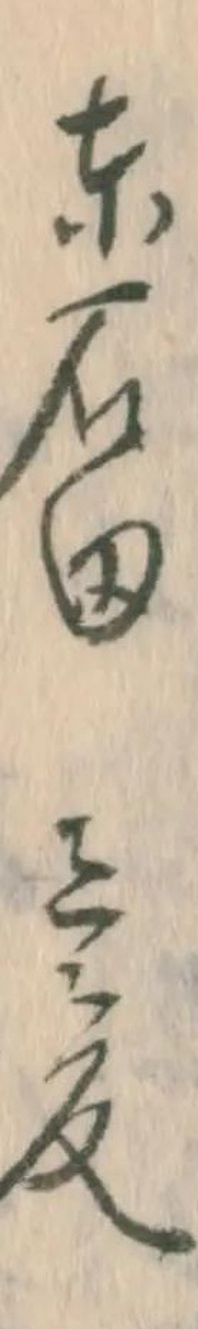東石田壱反
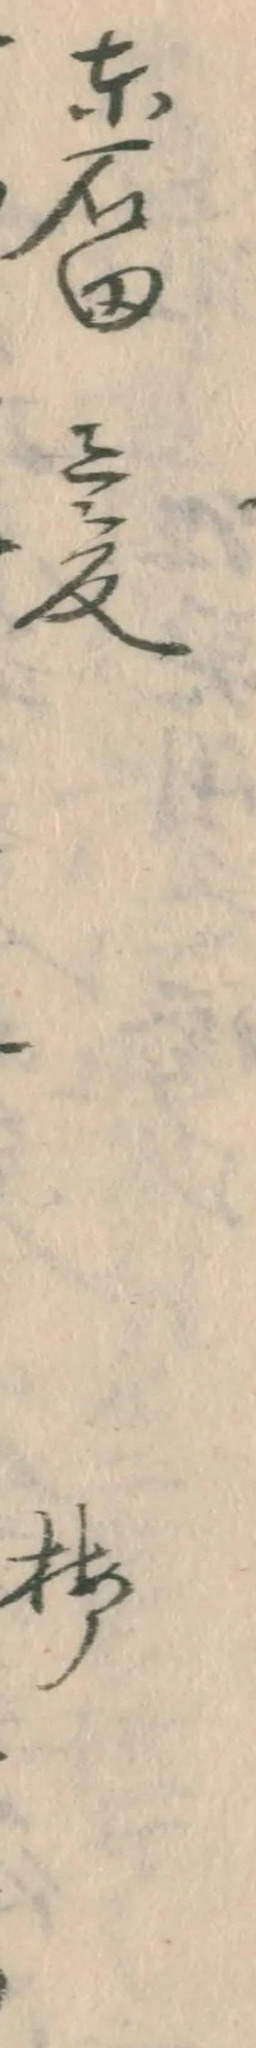東石田壱反
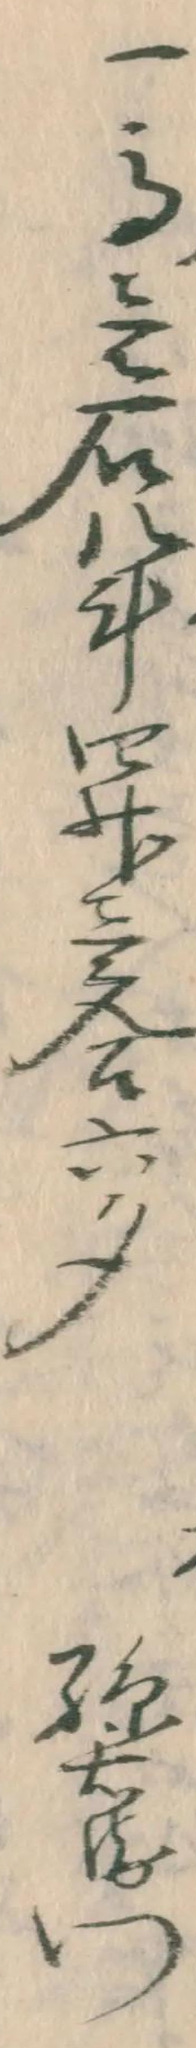一高壱石八斗四升壱合六夕梅ノ孫右衛門
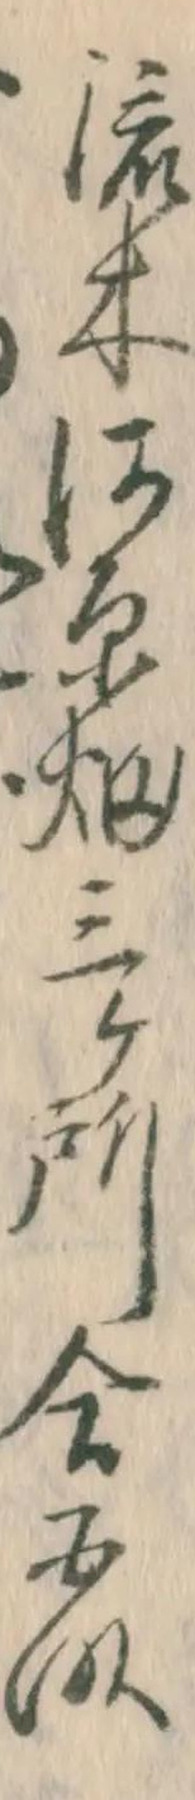流木河原畑三ヶ所合五畝
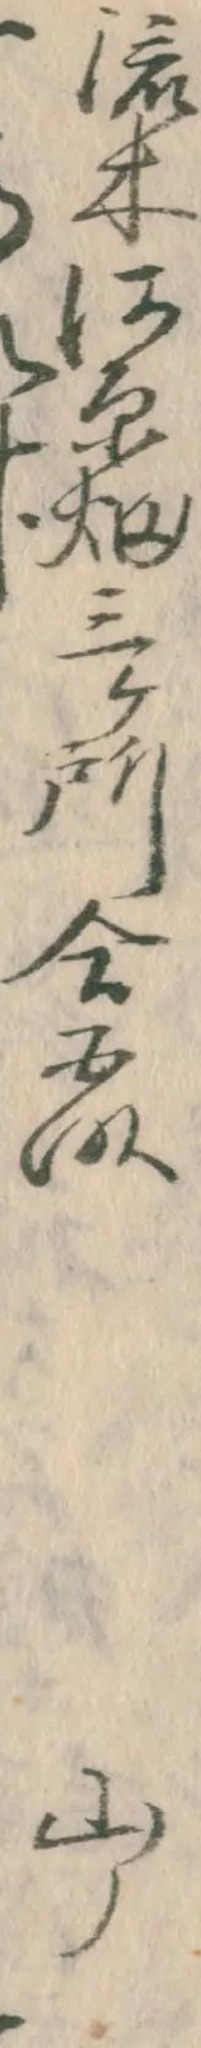流木河原畑三ヶ所合五畝
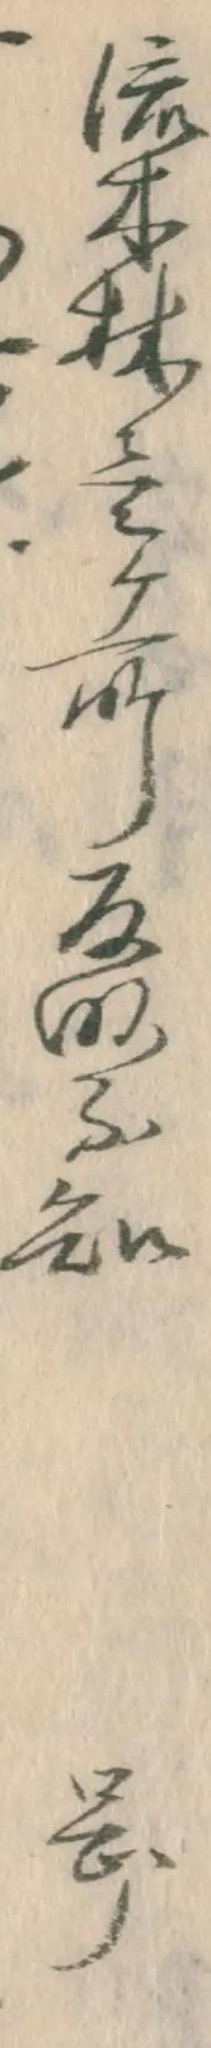流木林壱ヶ所反畝不知
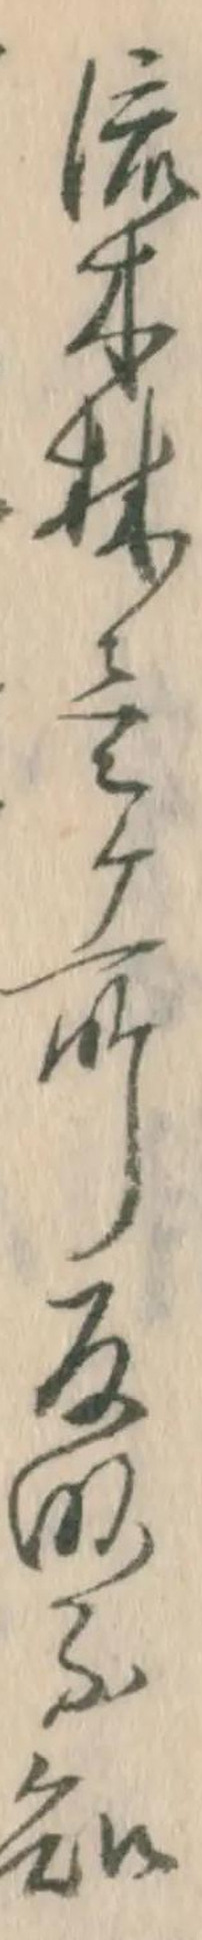流木林壱ヶ所反畝不知
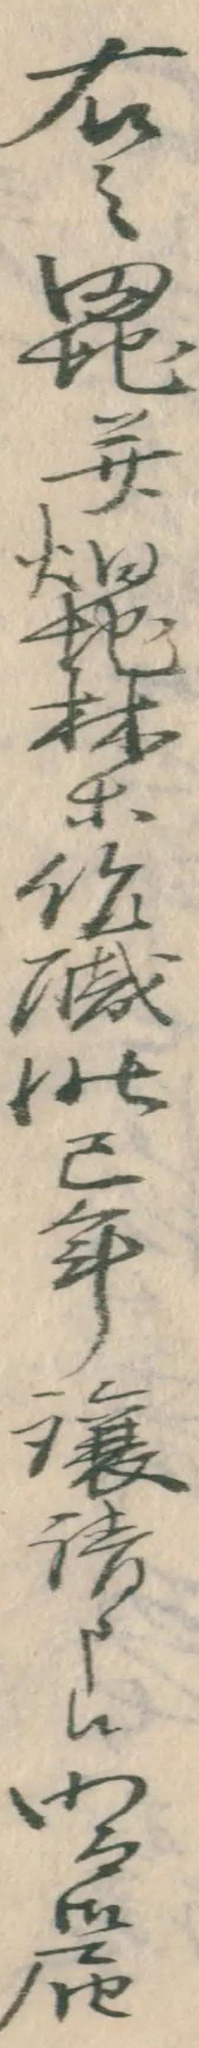右之田地并畑地林等作職昨巳年譲請申候仍而御届
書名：賀茂社記録. 第66冊
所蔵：国立国会図書館 National Diet Library, JAPAN
